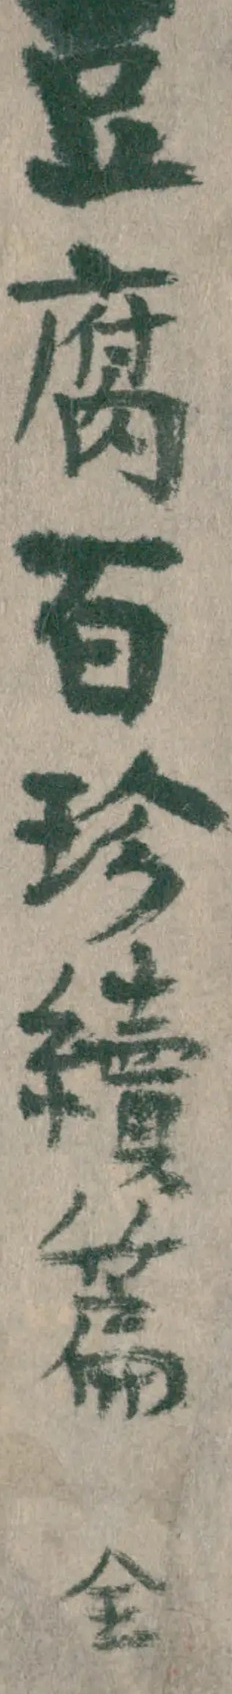豆腐百珍続編全

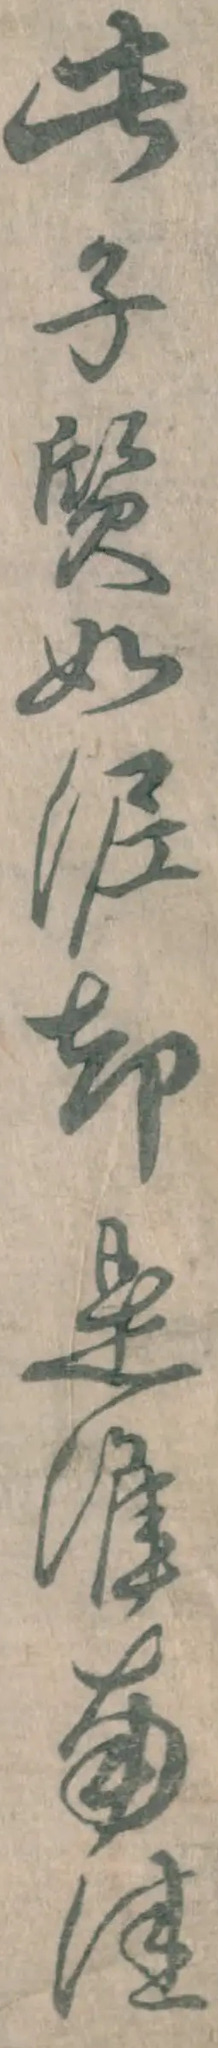此子質如泥却是淮南佳
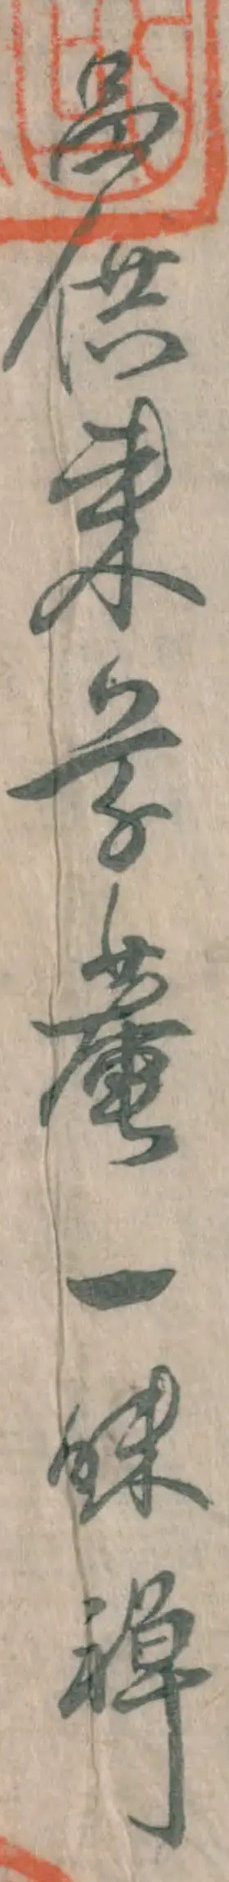品供来草庵一味禅
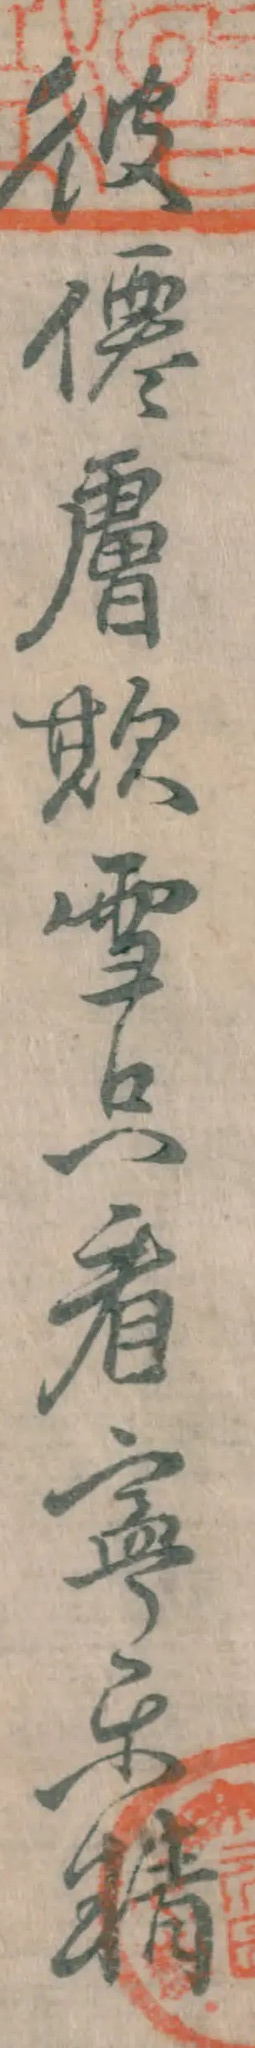彼僊膚欺雪只看寧楽精
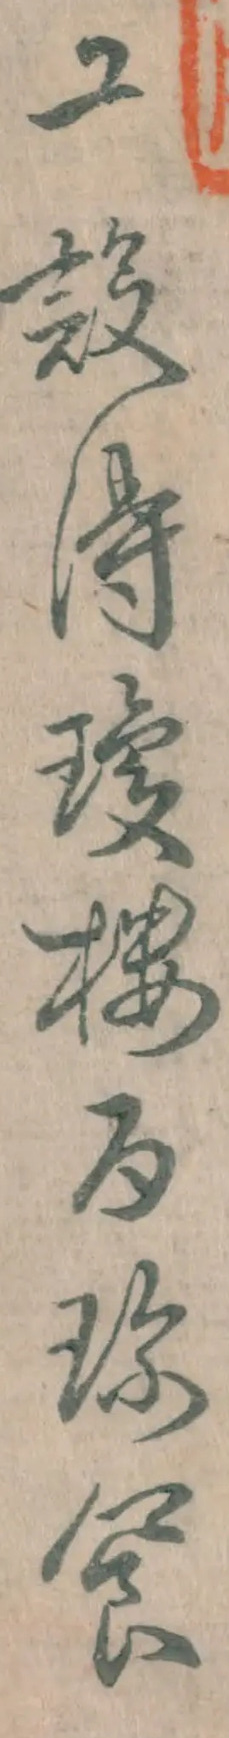工設得瓊楼而珍饗
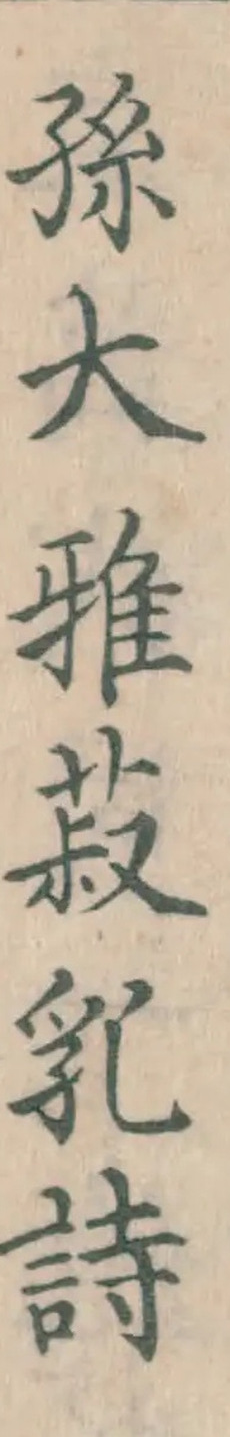孫大雅菽乳詩
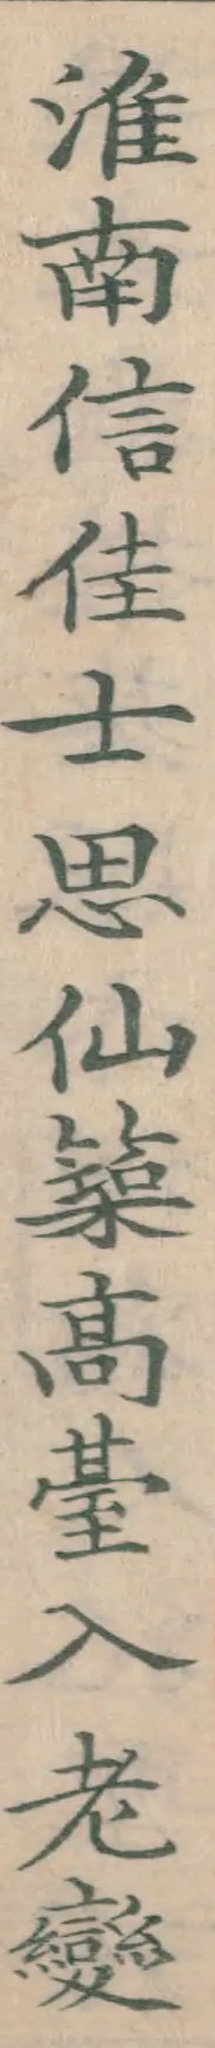淮南信佳士思仙築高台入老変
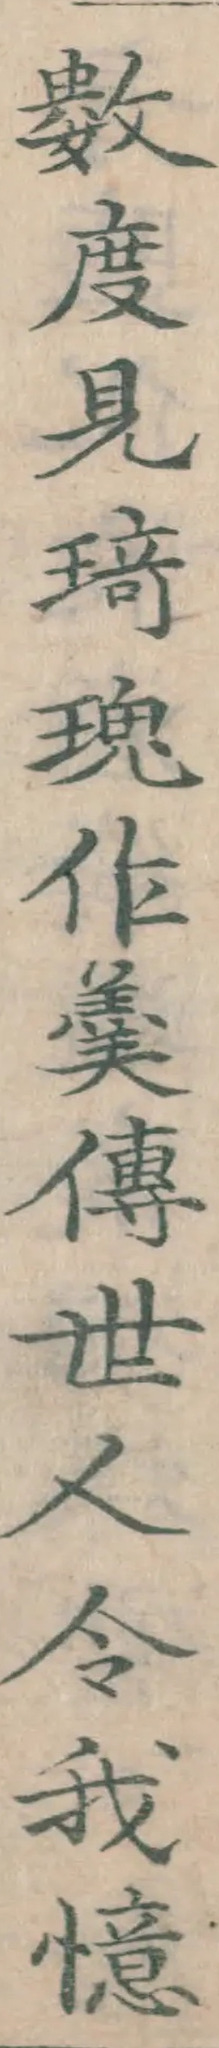数度見琦瑰作羹伝世人令我憶
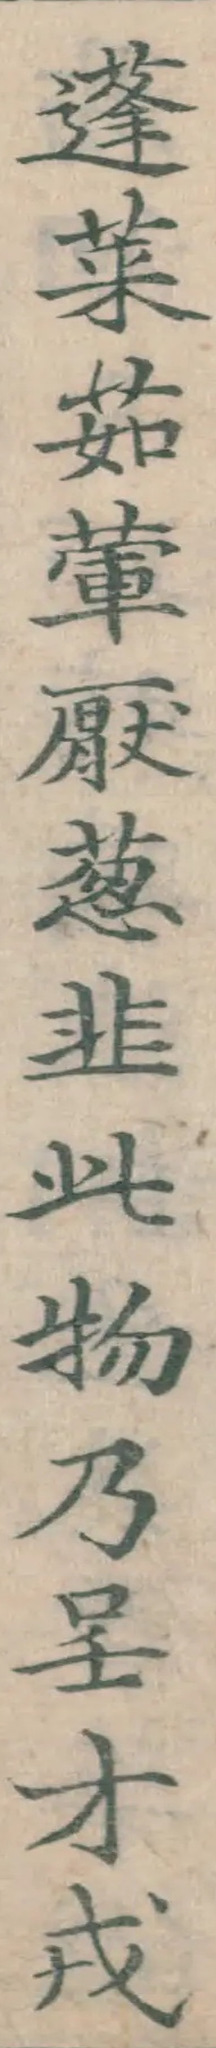蓬萊茹葷厭葱韭此物乃呈才戎
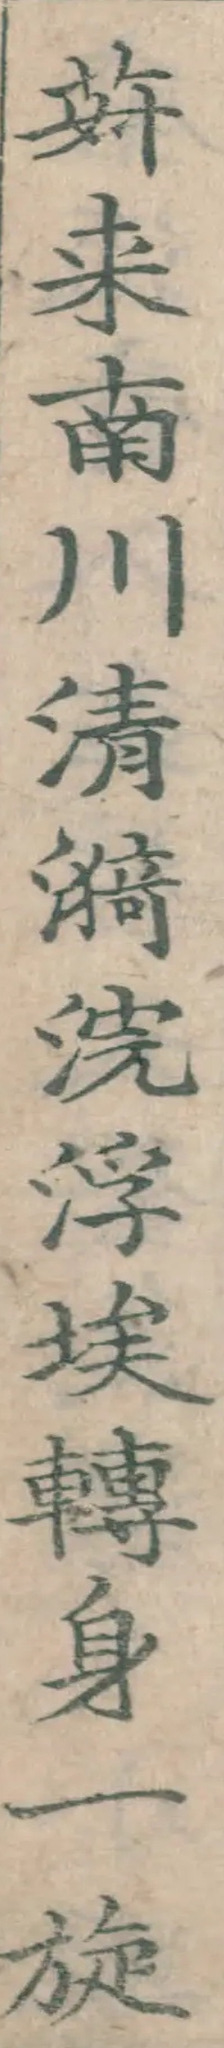菽来南川清漪浣浮埃転身一旋

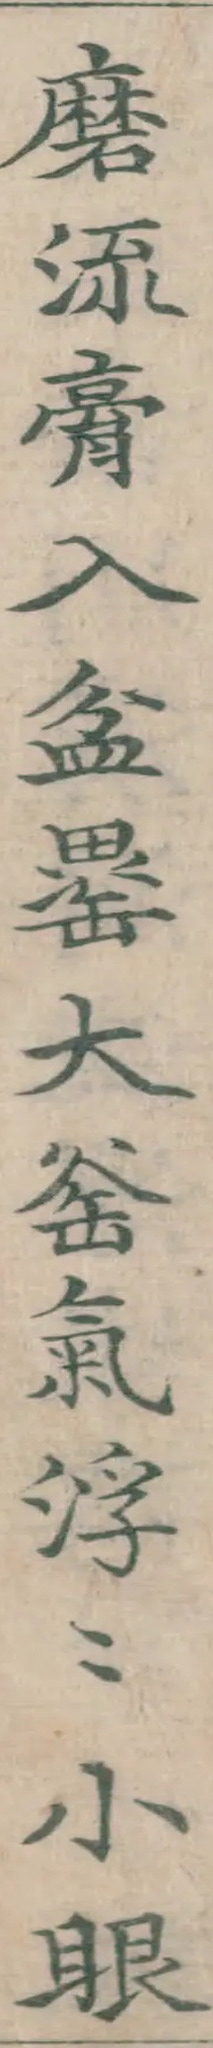磨流膏入盆罍大釜気浮々小眼
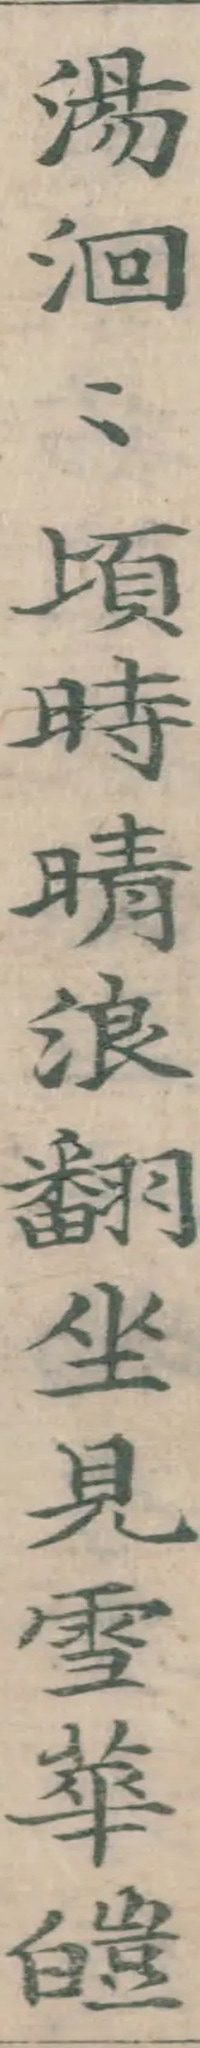湯洄々頃時晴浪翻坐見雪華皚
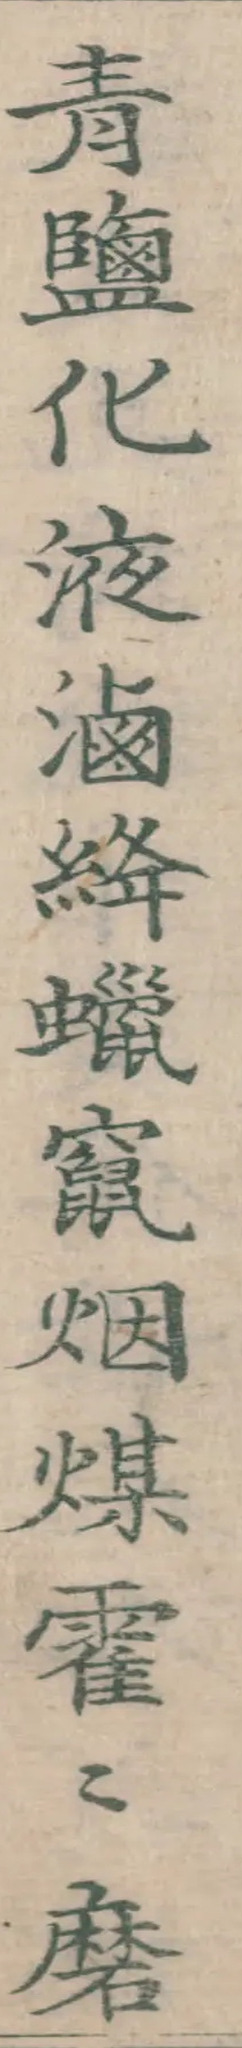青塩化液滷絳蝋竄煙煤霍々磨
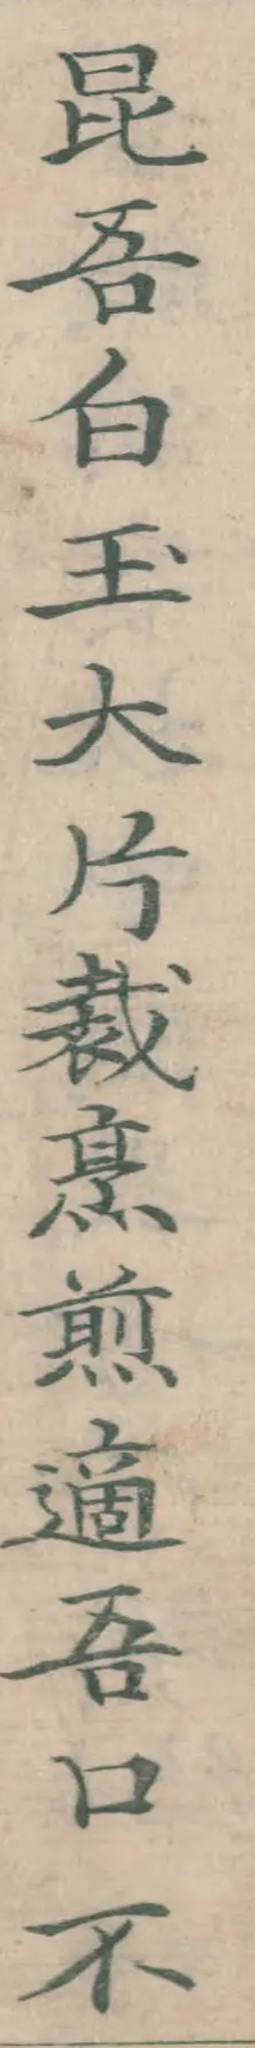昆吾白玉大片裁烹煎適吾口不
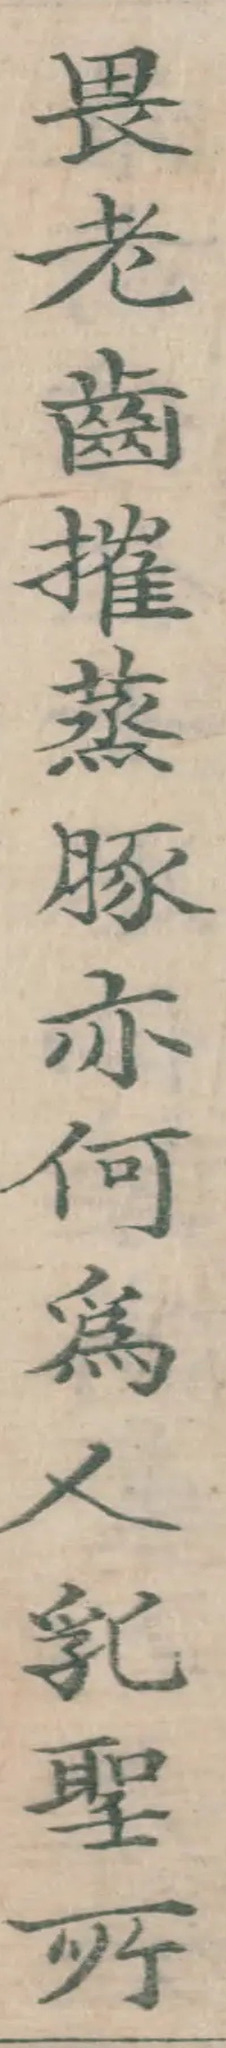畏老歯摧蒸豚亦何為人乳聖所
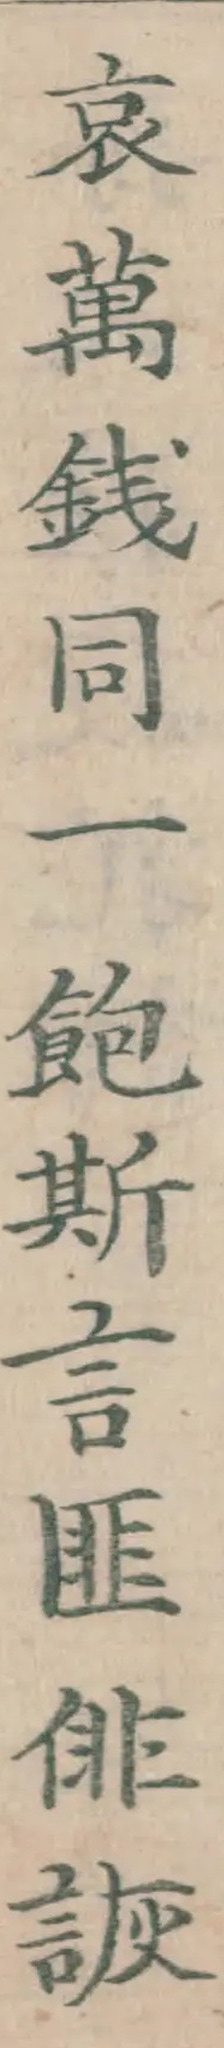哀万銭同一飽斯言匪俳詼
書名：豆腐百珍. 続編
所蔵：国立国会図書館 National Diet Library, JAPAN
